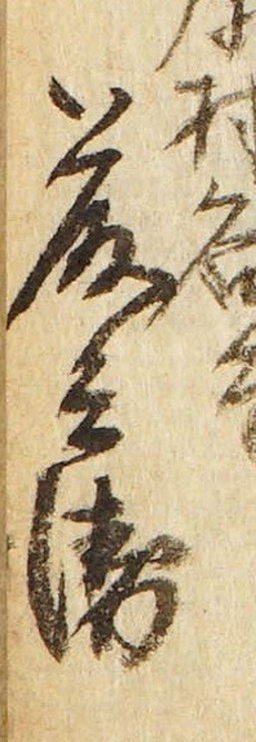藤兵衛

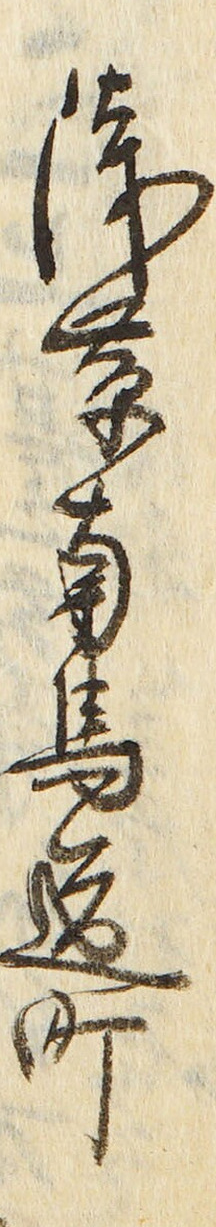浅草南馬道町
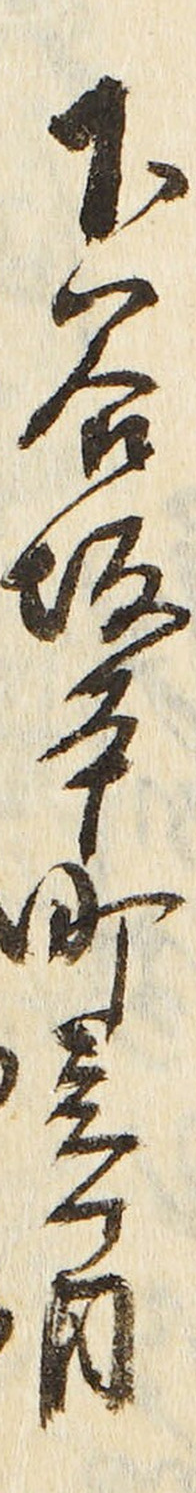下谷坂本町壱丁目
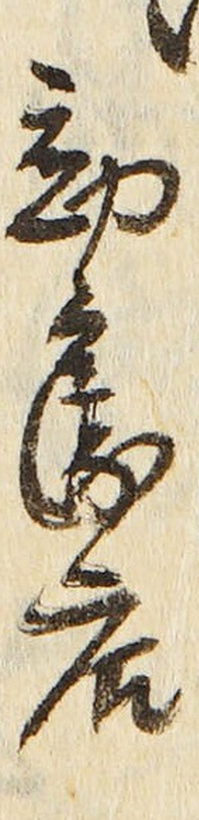勘兵衛店
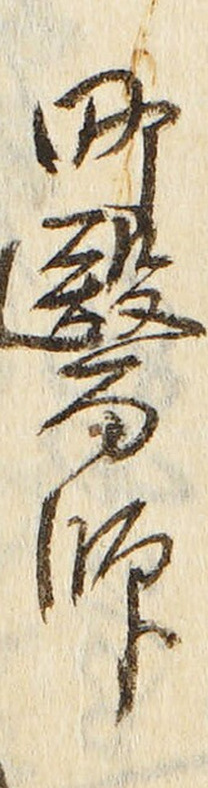町医師
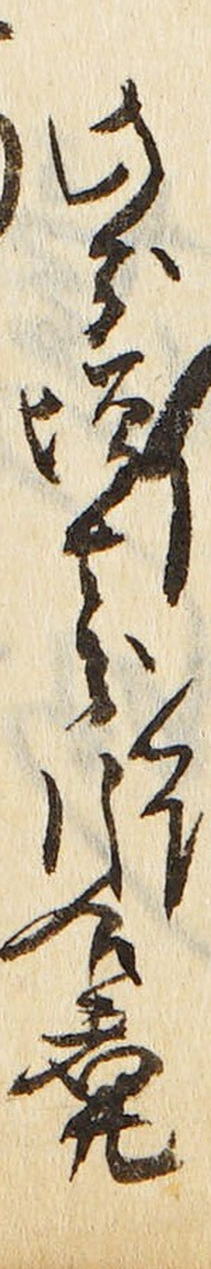此分増十郎引合者共
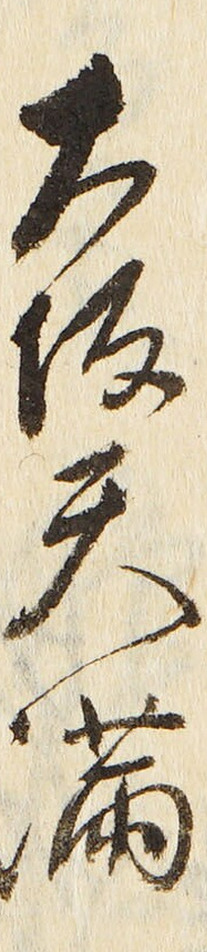大坂天満
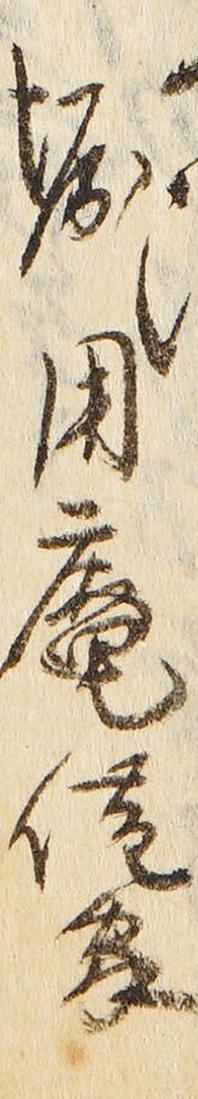堀用庵借家
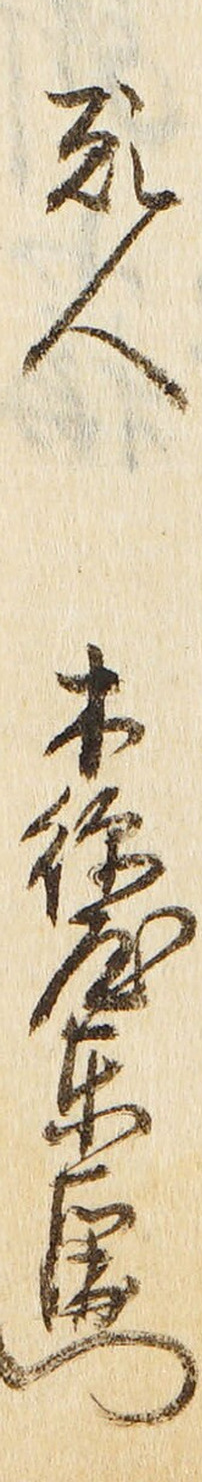願人木綿屋東右衛門
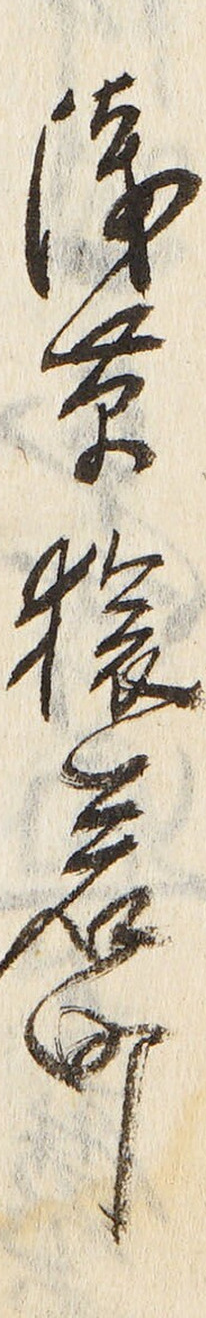浅草猿若町
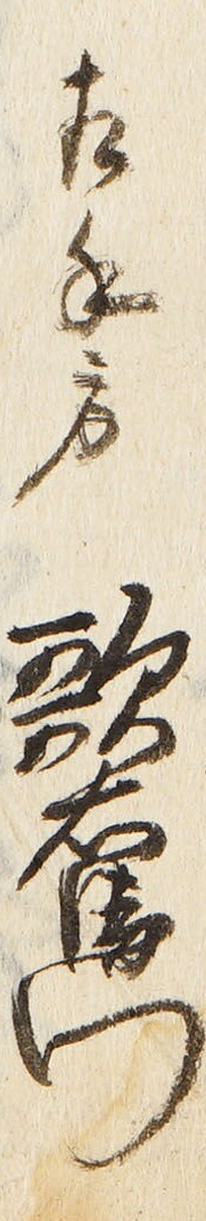相手方歌右衛門
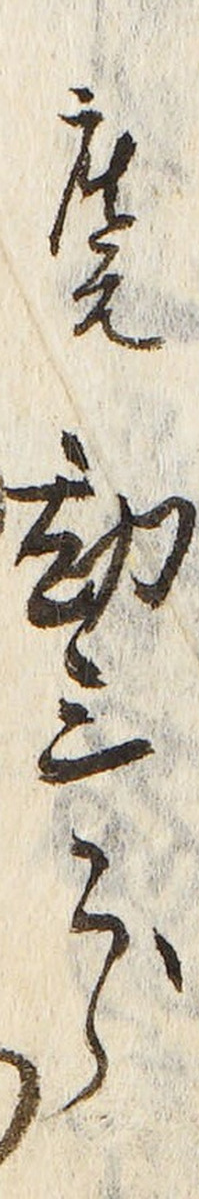座元勘三郎
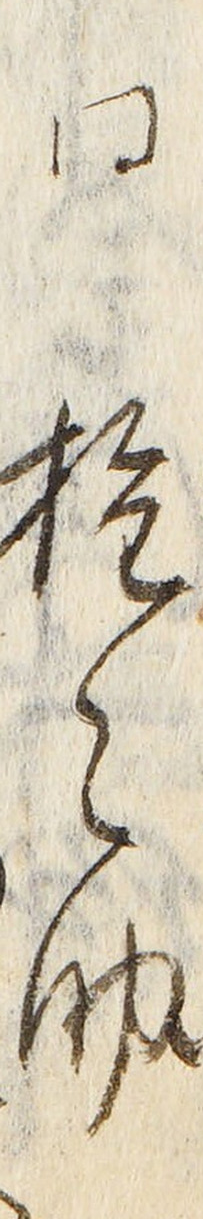同権之助
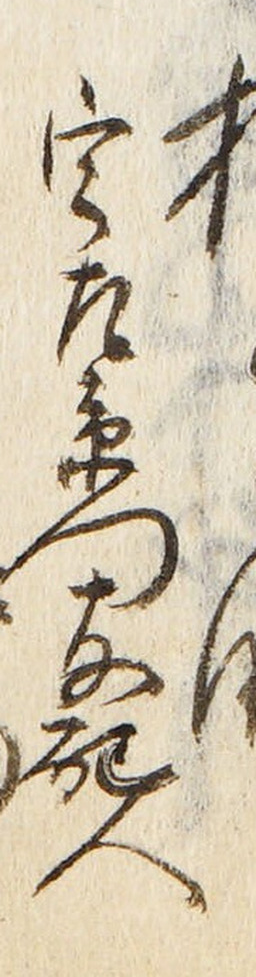宇左衛門支配人
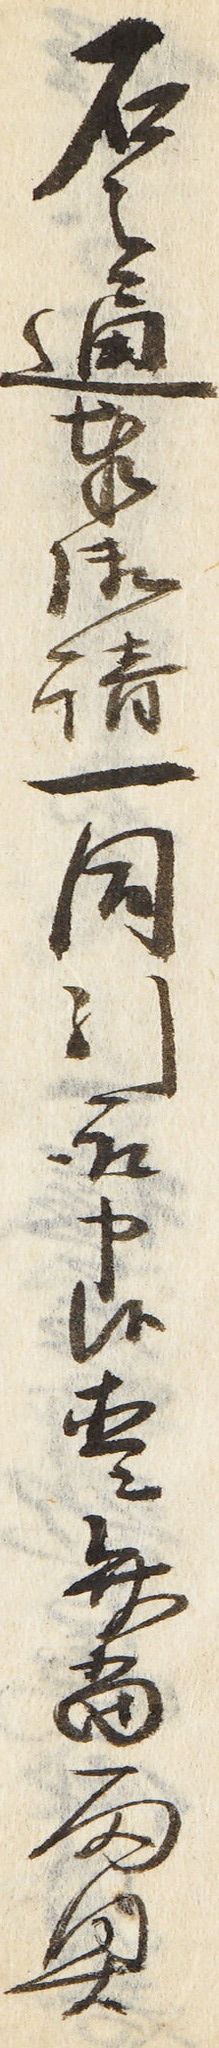右之通奉御請一同引取申候直に弁当雨具
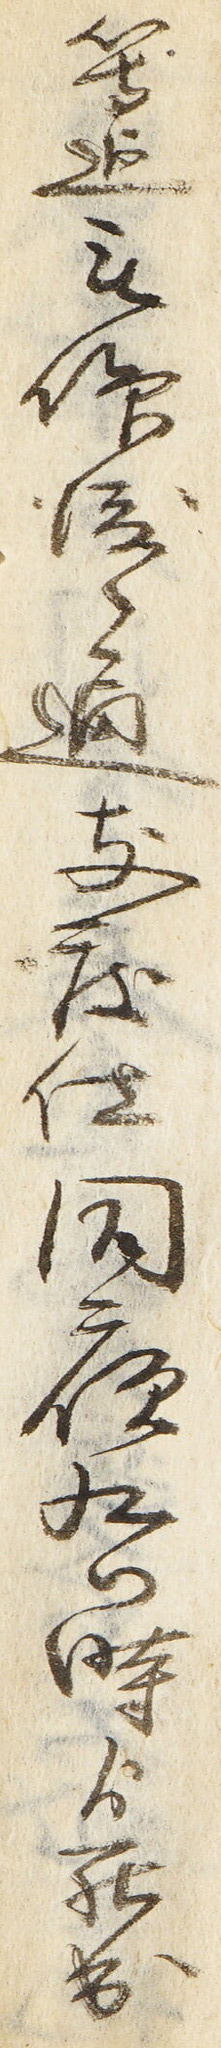等迠被仰渡候通支度仕同夜九ツ時ゟ罷出
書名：異流一件日記
